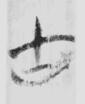古
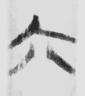六
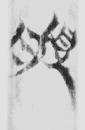{肉頁}
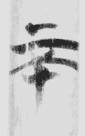不
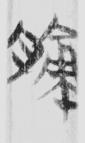{肉朿}
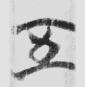五
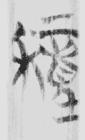穜
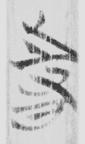時
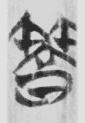{竹亯}
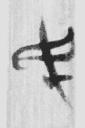民
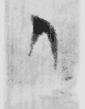人
